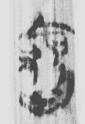噞
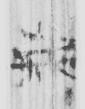者
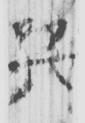巽
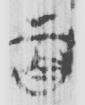百
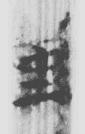里
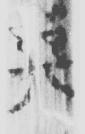巽
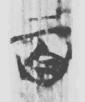百
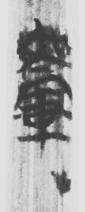{舛亼車}
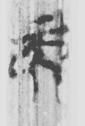而
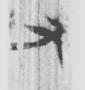又
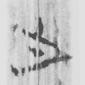之
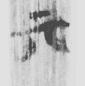亓
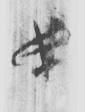民
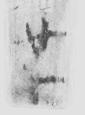{廿七}
